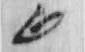㠯（以）
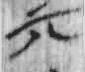亓（其）
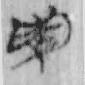受
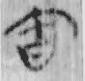缶
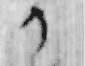人
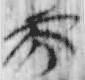而
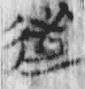逃
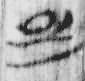疋
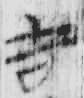吉
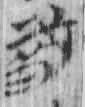戠
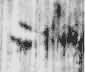之
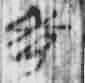秀
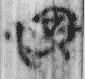渒
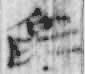爲
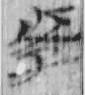李
